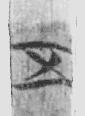五
